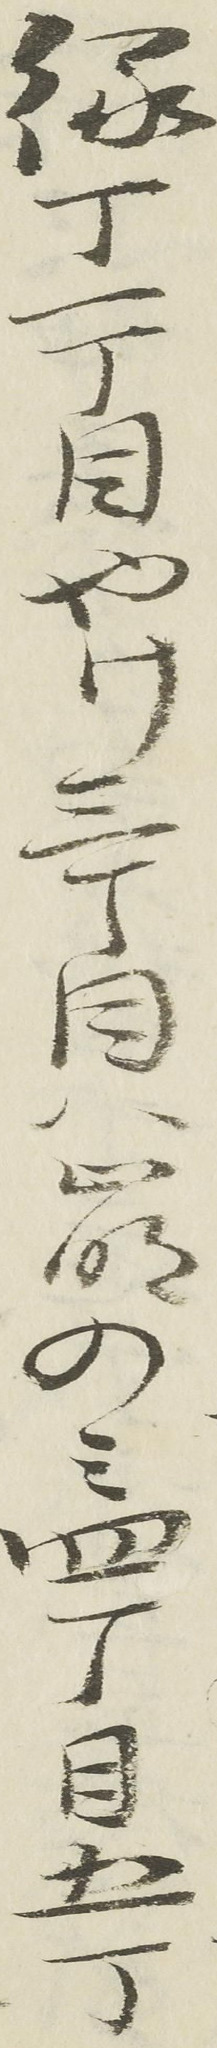縁丁一丁目やけ三丁目ハ崩のミ四丁目五丁
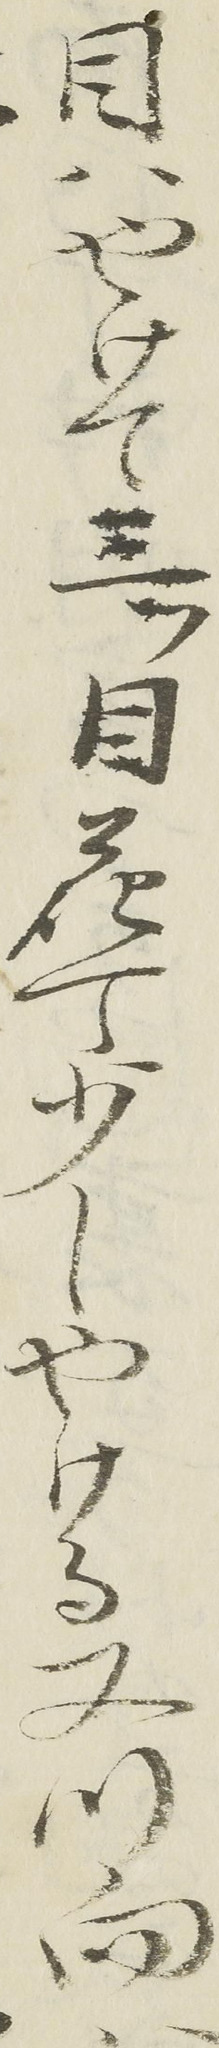目ハやけて三ツ目花丁少しやける又川向ハ
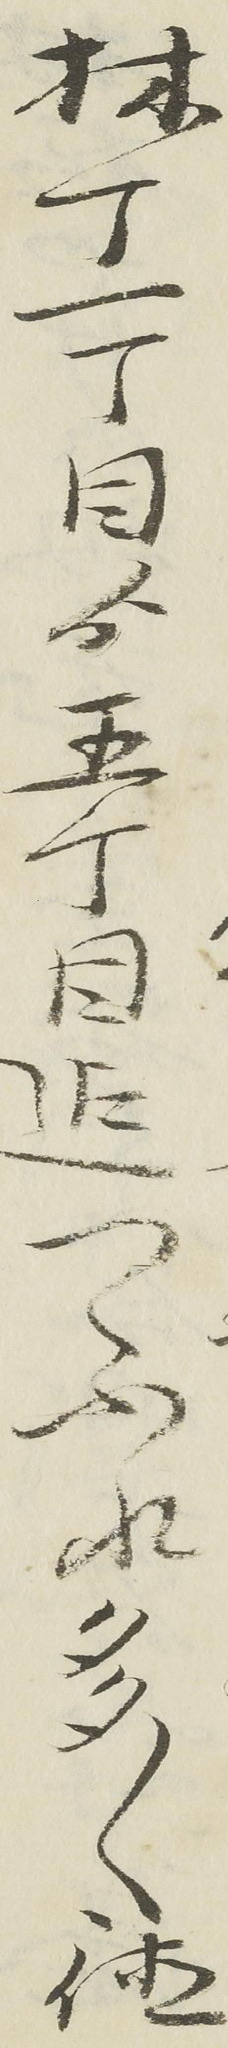林丁一丁目ゟ五丁目迄つふれ多く徳
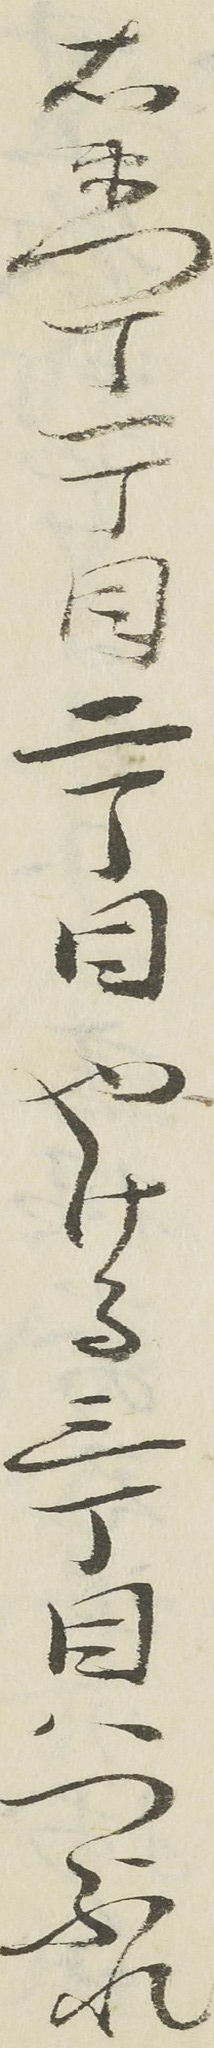右衛門丁一丁目二丁目やける三丁目ハつぶれ
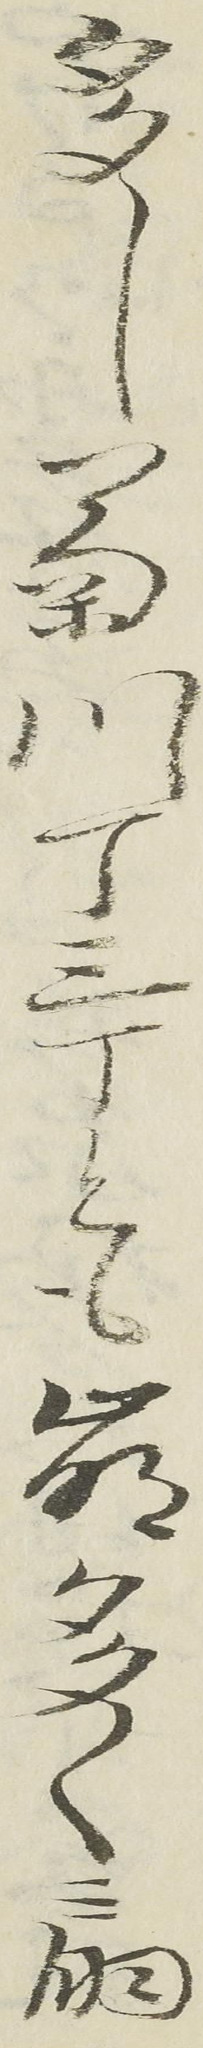多し菊川丁三丁とも崩多く扇
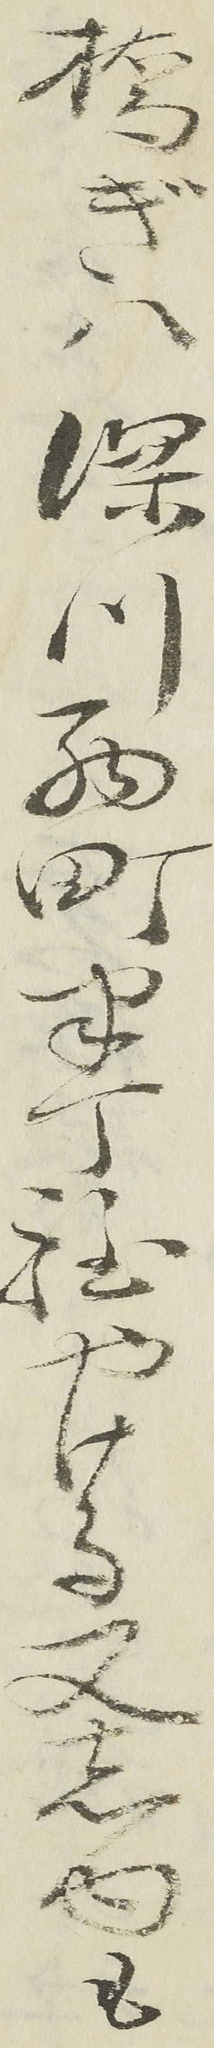橋ぎハ深川西町半丁程やける又しゆも
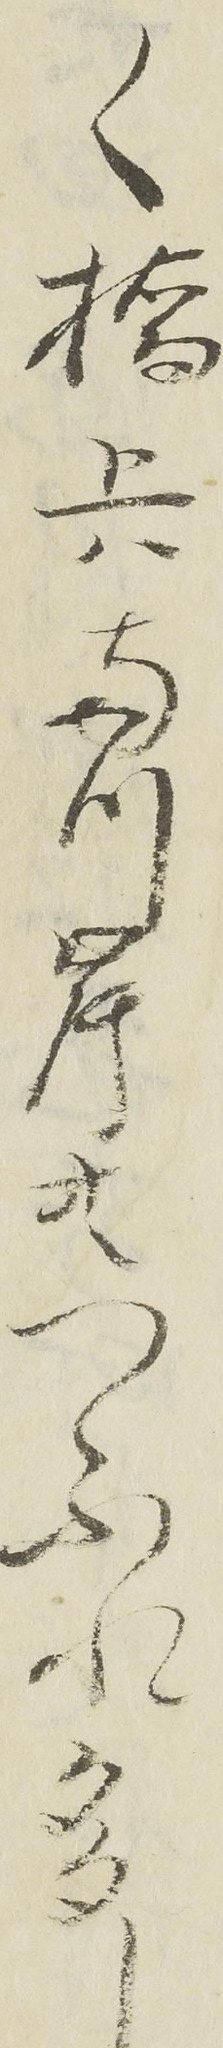く橋上ハ両川岸共つふれ多し

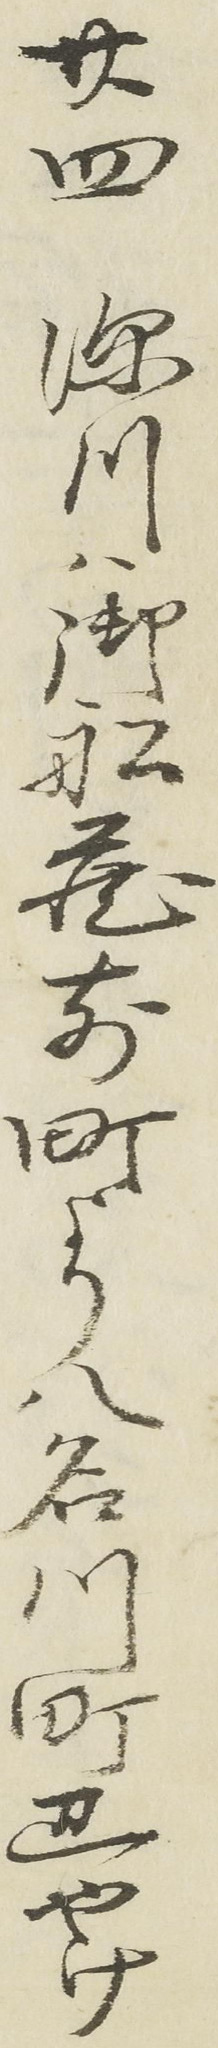廿四深川ハ御船蔵前町より八名川町辺やけ
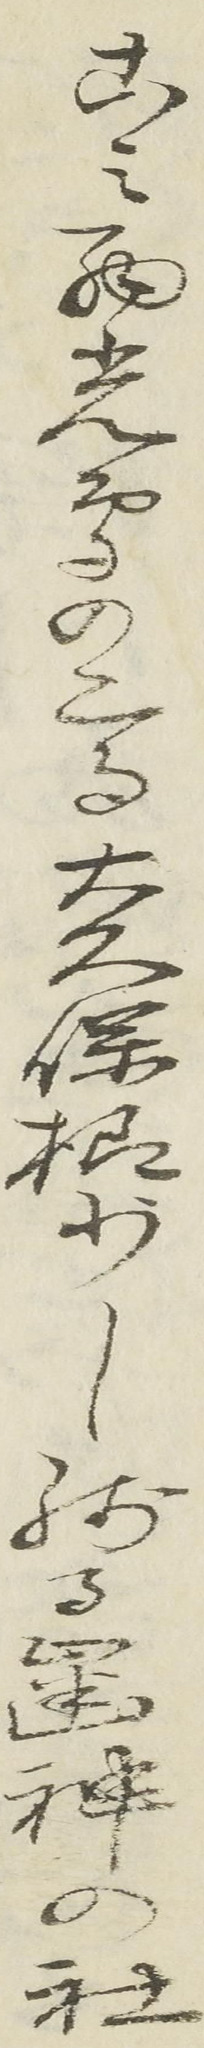こミ西光寺のこる大久保様少し残る歯神の社
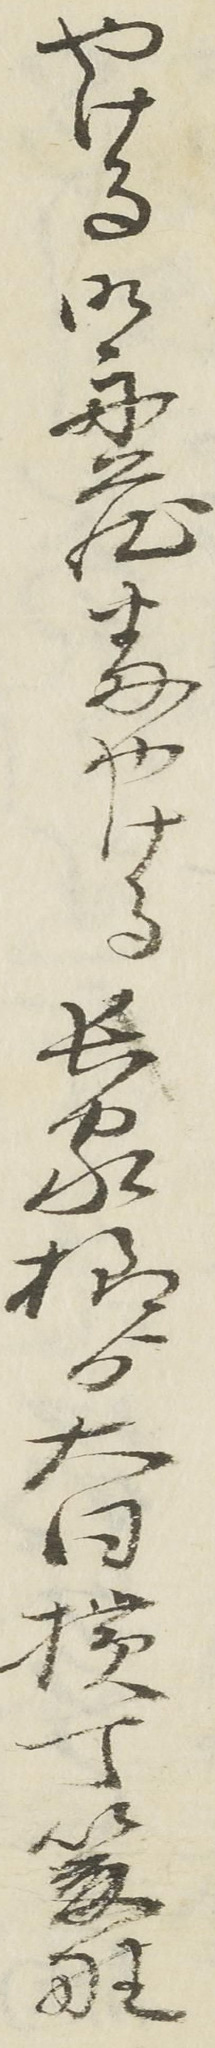やける御舟蔵番やける長家様ゟ大日横丁管野
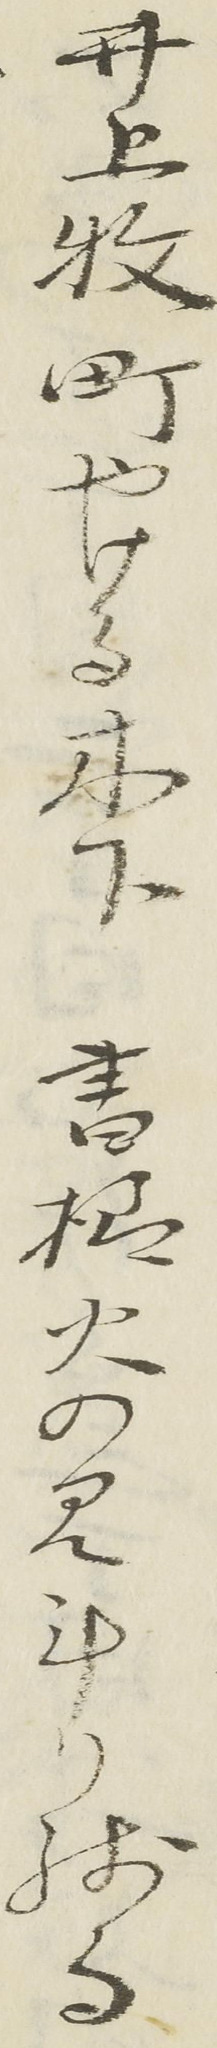井上牧町やける木下書様火の見斗り残る
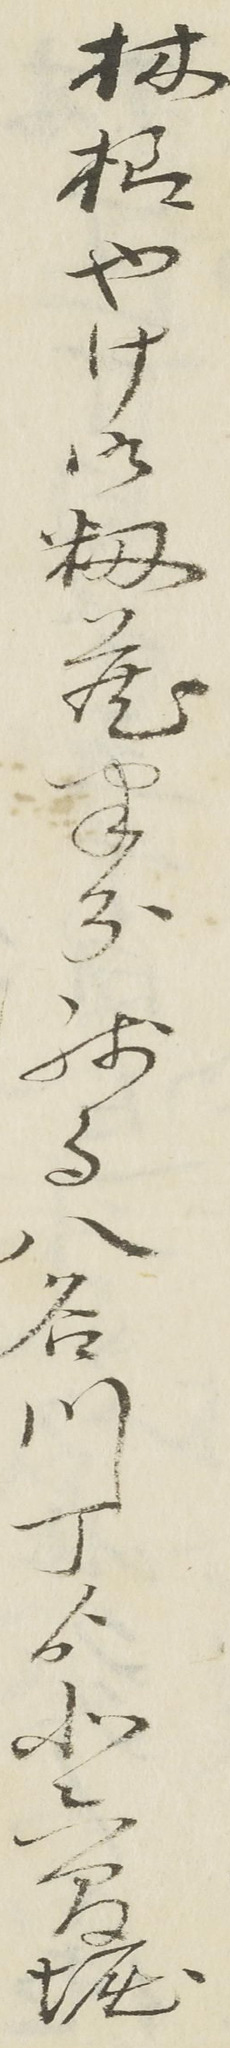林様やけ御籾蔵半分残る八名川丁ゟ北六間堀
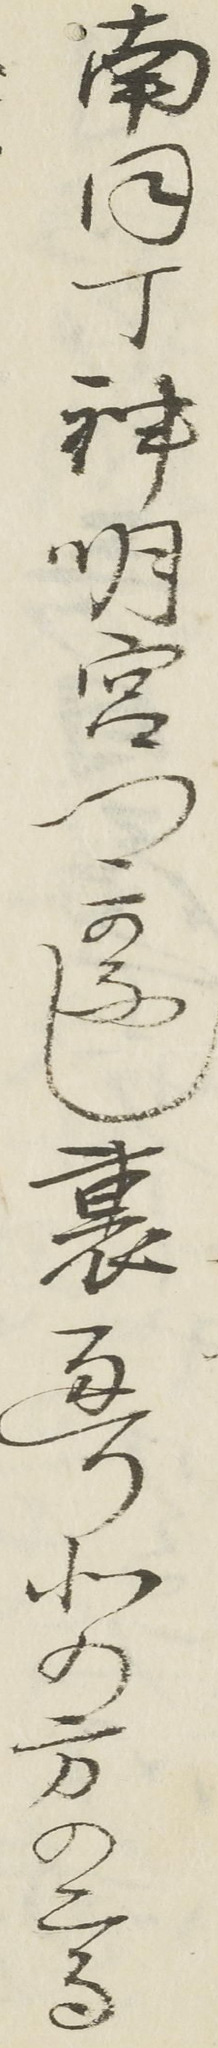南同丁神明宮つゝかなし裏通り北の方のこる
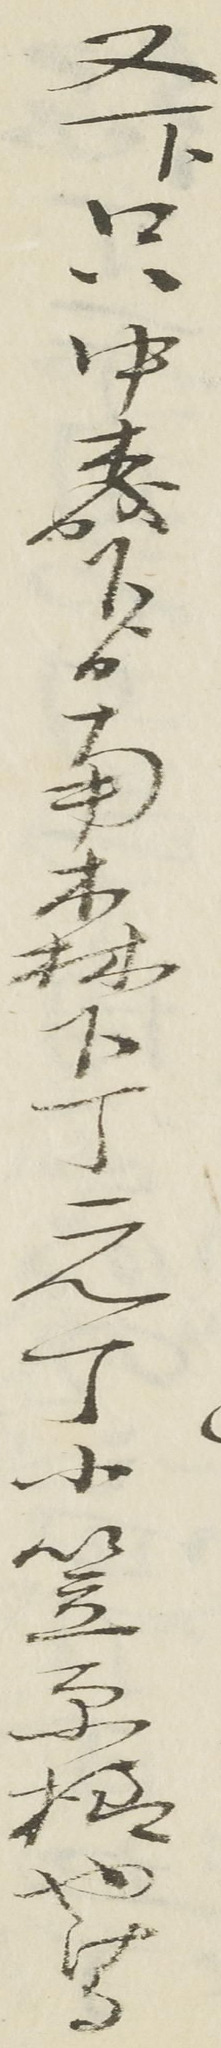又一ト口ハ中森下ゟ南森下丁元丁小笠原様やける
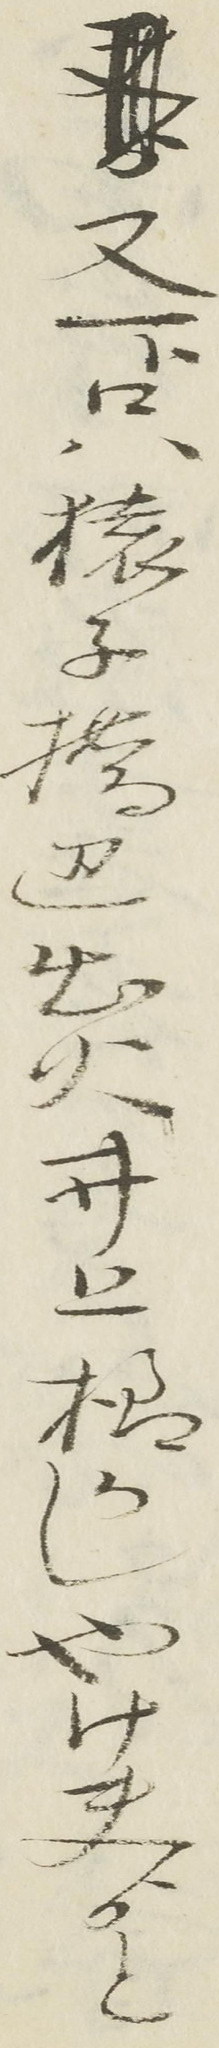又一ト口ハ猿子橋辺出火井上様かしやけ夫ゟと
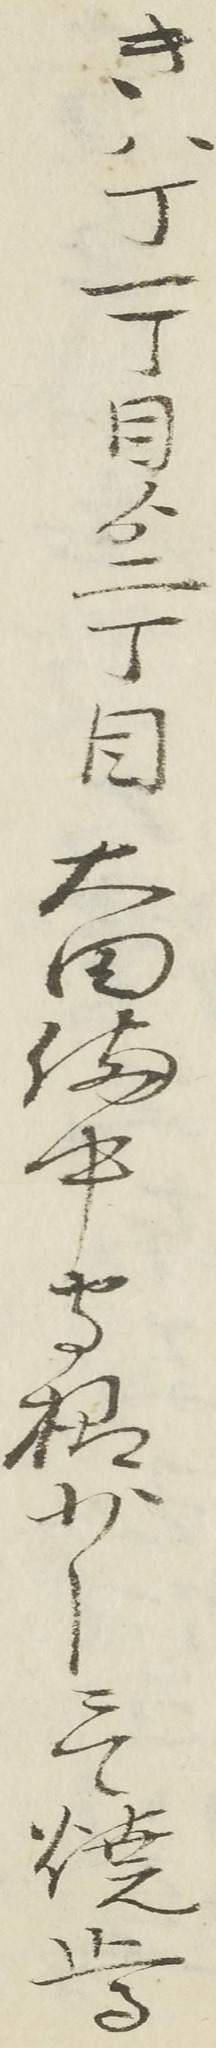きハ丁一丁目ゟ二丁目太田備中守様少しニて焼止る
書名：安政乙卯江戸大地震筆記　安政丙辰八月大阪大雷雨之記追加　安政三辰年七月松前辺大地震并八月大風雨記録
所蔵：東京大学地震研究所図書室 Earthquake Research Institute Library, The University of Tokyo, JAPAN
